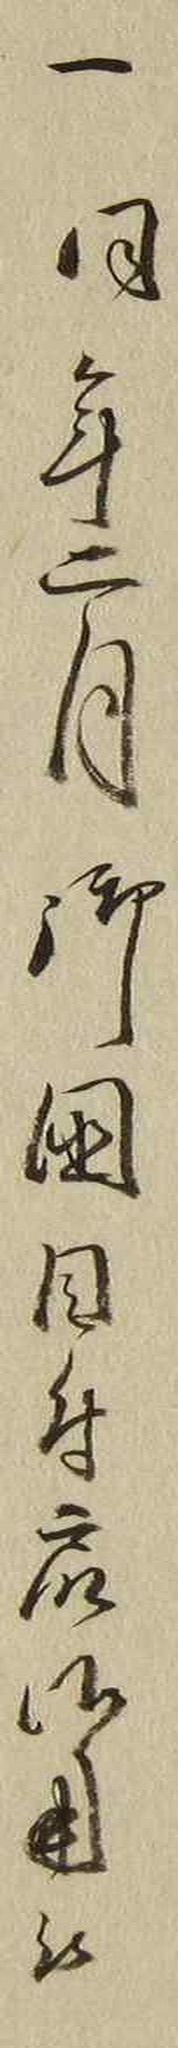一同年二月御国目付衆御用被
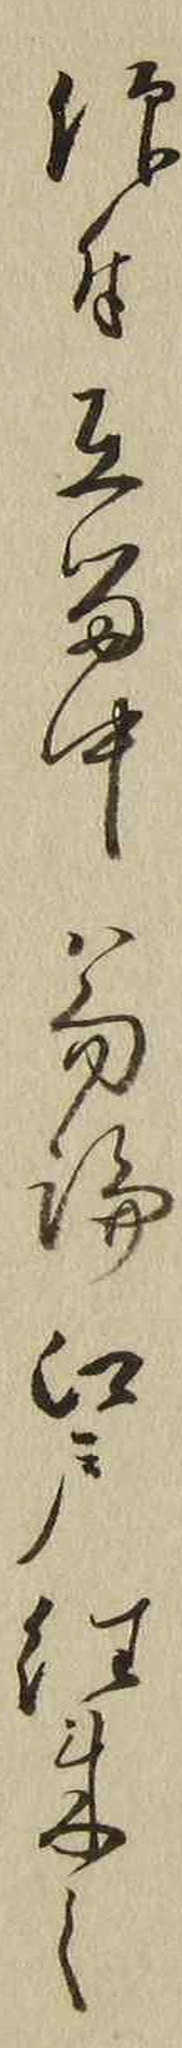仰付在留中ハ勿論江戸往来之
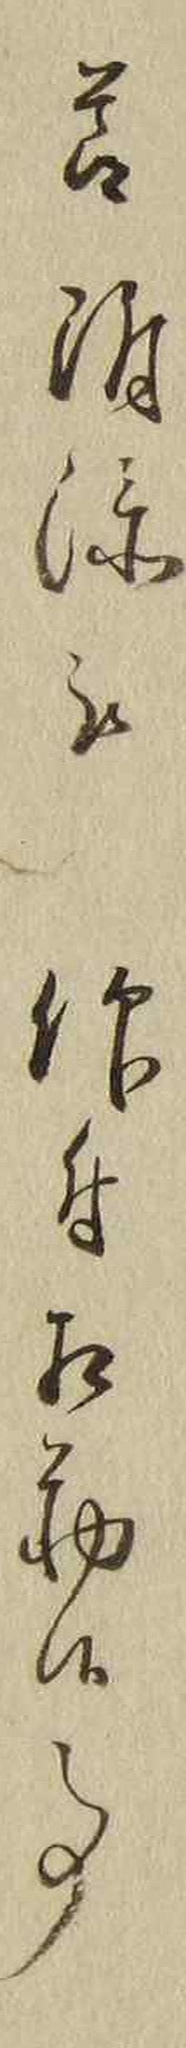節附添被仰付相勤候事
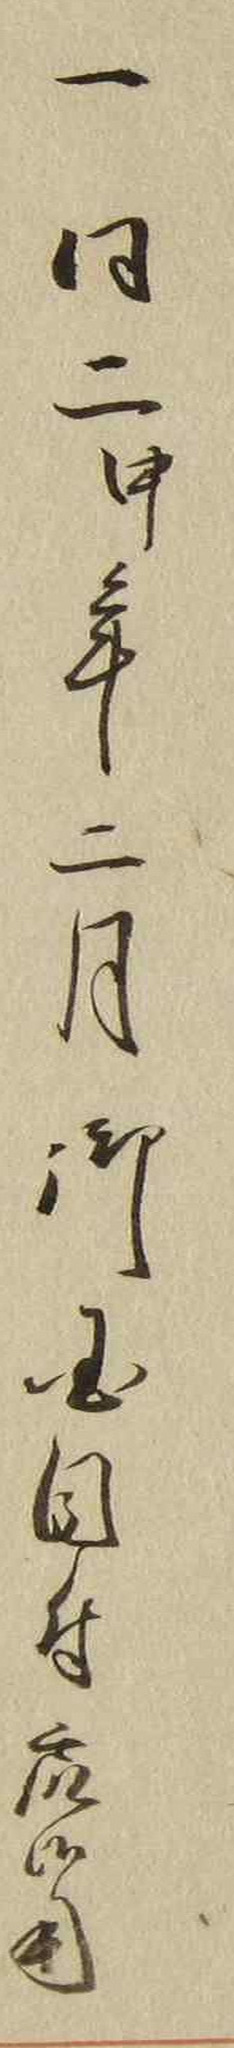一同二申年二月御国目付衆御用

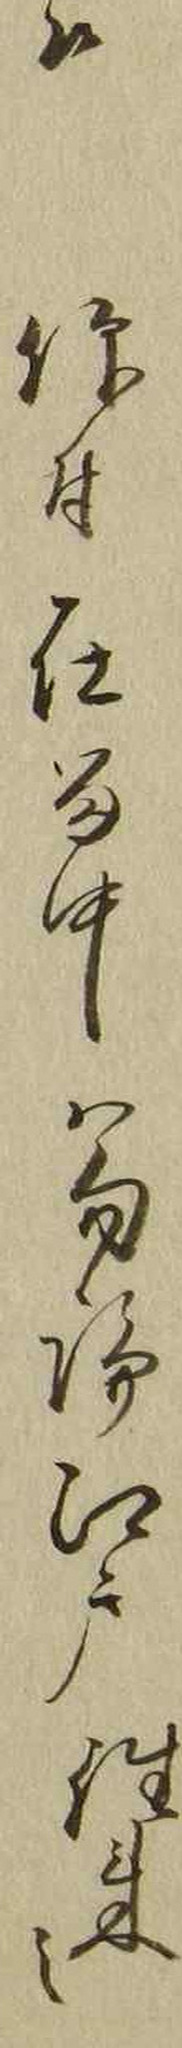被仰付在留中ハ勿論江戸往来之
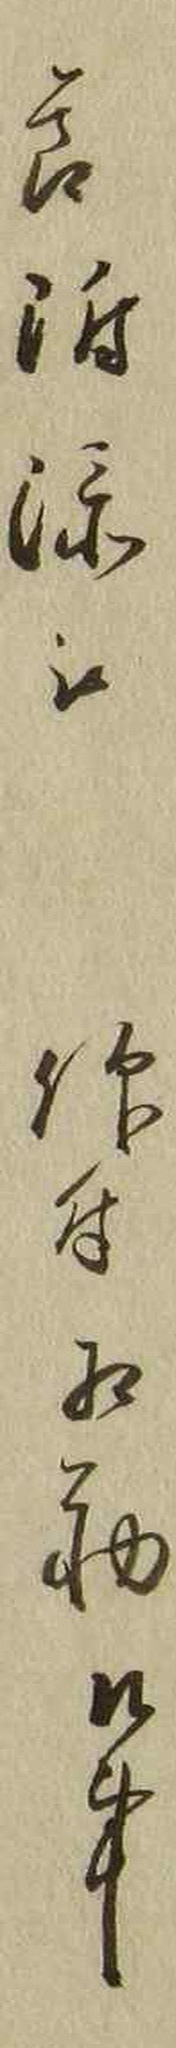節附添被仰付相勤候事
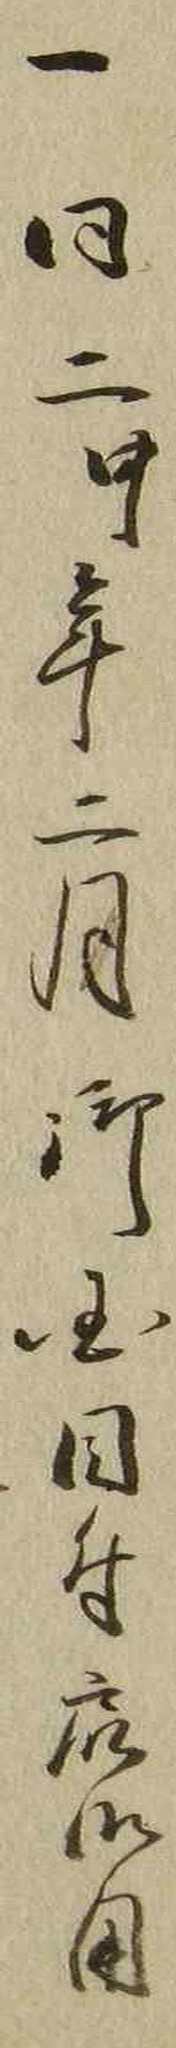一同二申年二月御国目付衆御用
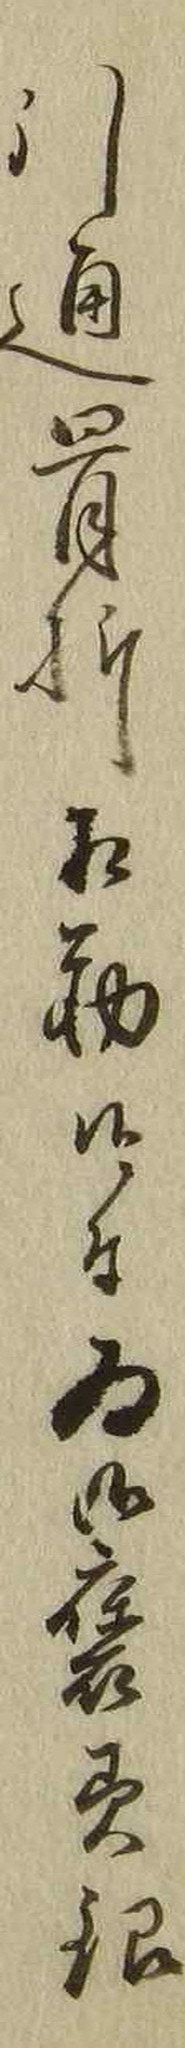引通骨折相勤候ニ付為御褒美銀
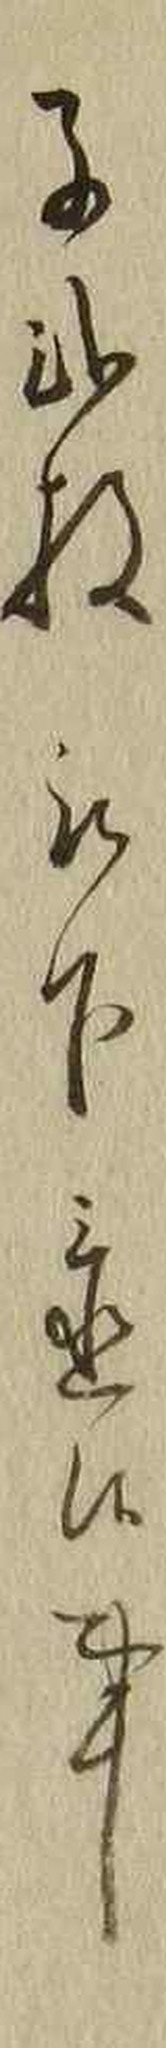子弐枚被下置候事
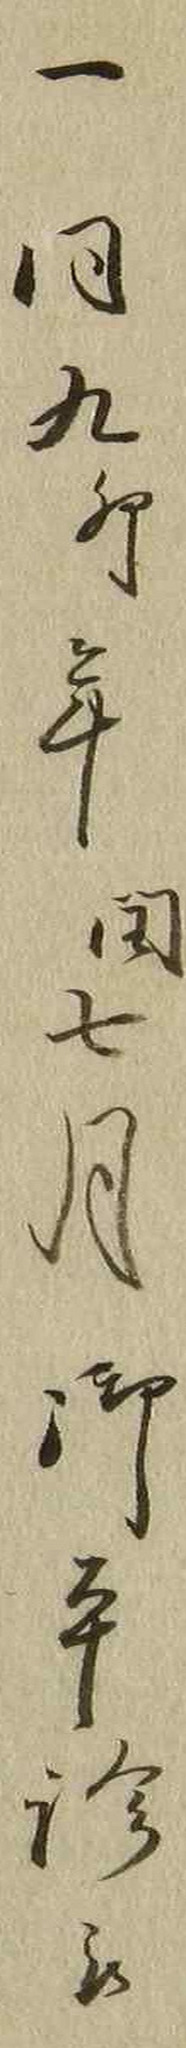一同九卯年閏七月御本診被
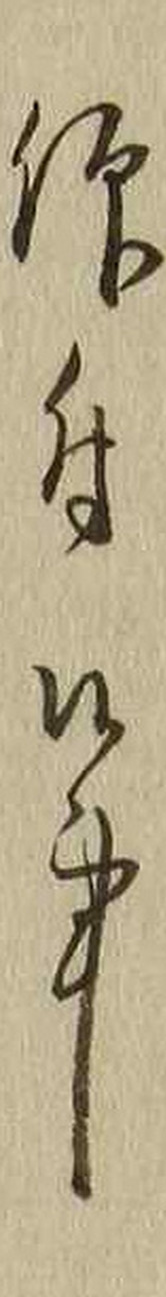仰付候事
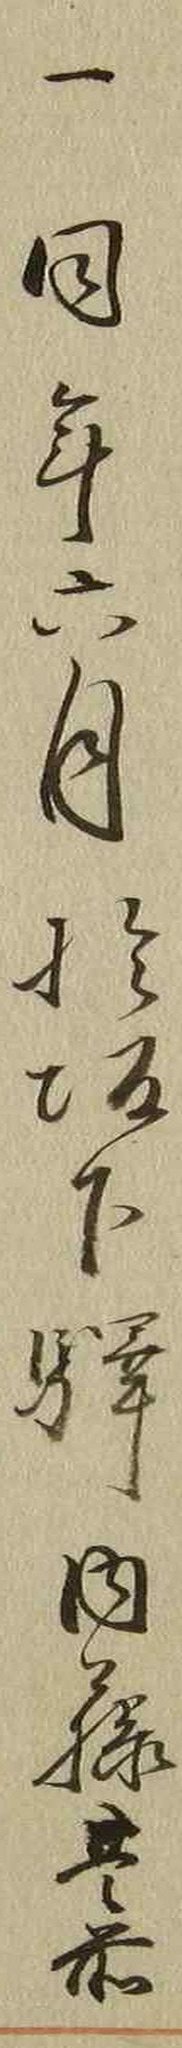一同年六月於坂下駅内藤豊前
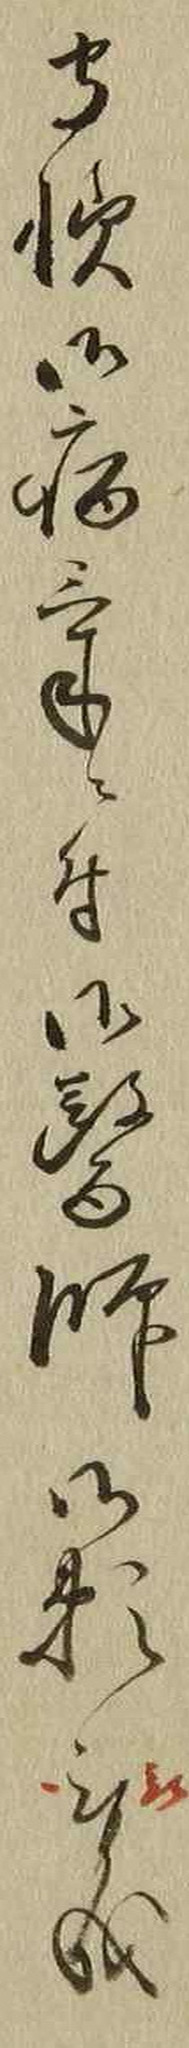守様御病気ニ付御医師御頼被成
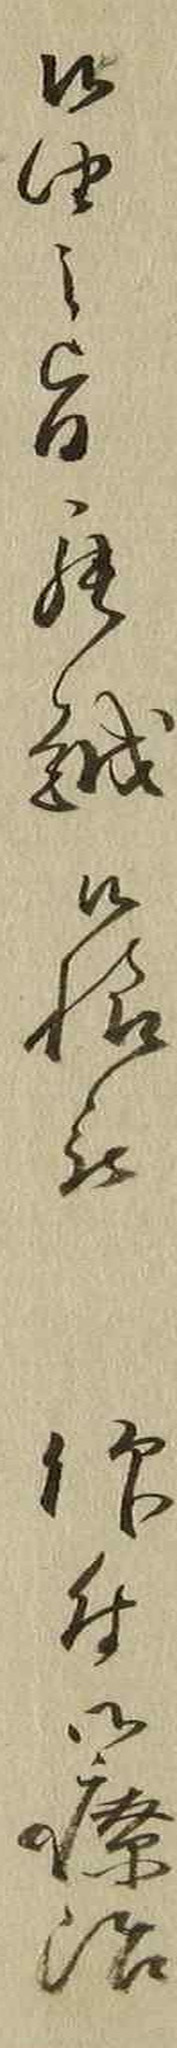候由之旨罷越候様被仰付御療治
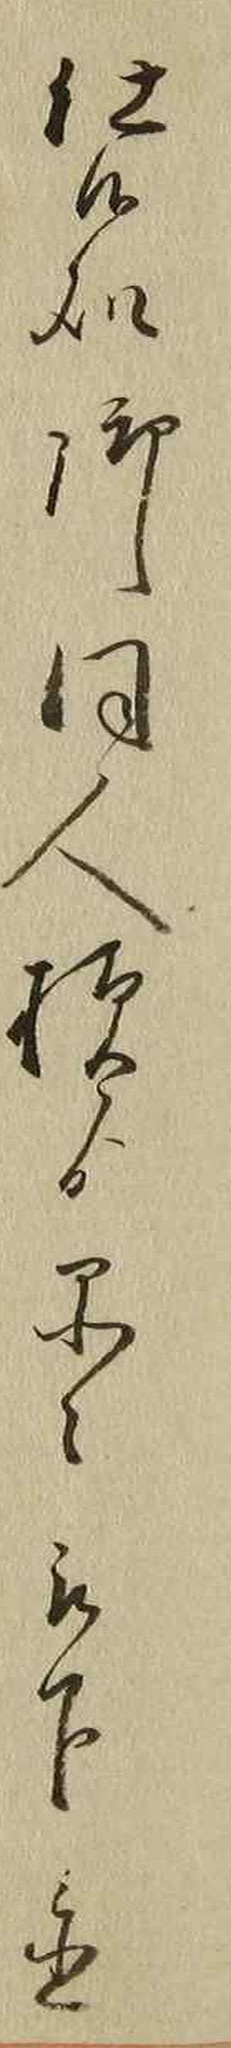仕候処御同人様ゟ品々被下置
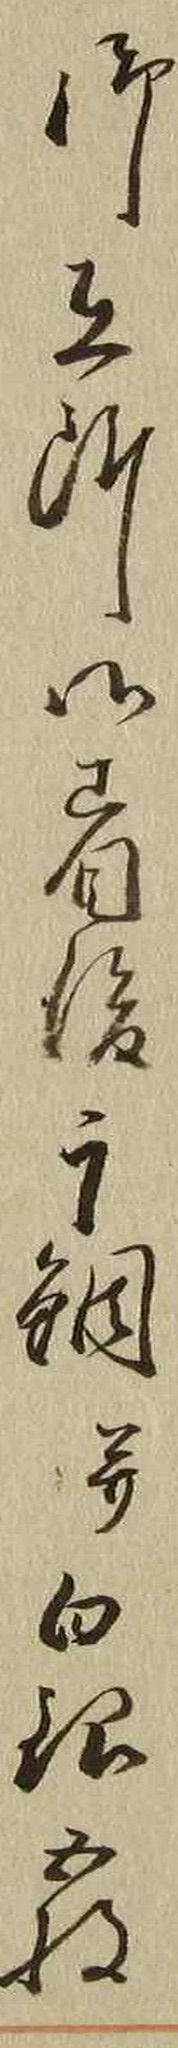御在所御着後干鯛并白銀五枚
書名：諸士系譜　巻之68　を之部2
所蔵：会津若松市立会津図書館
